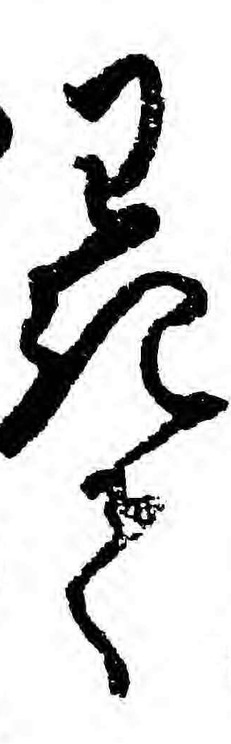わきて
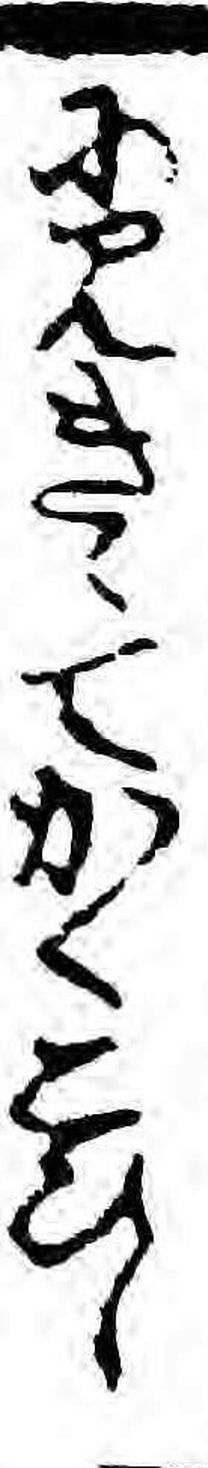に見きゝてかくこひし
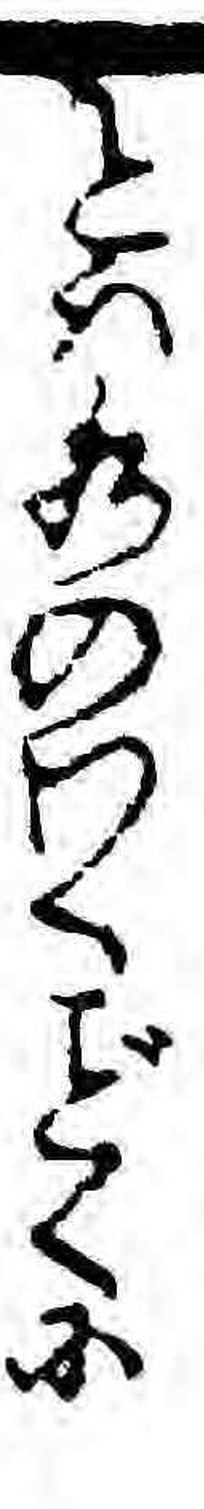とは水のわくごとくに
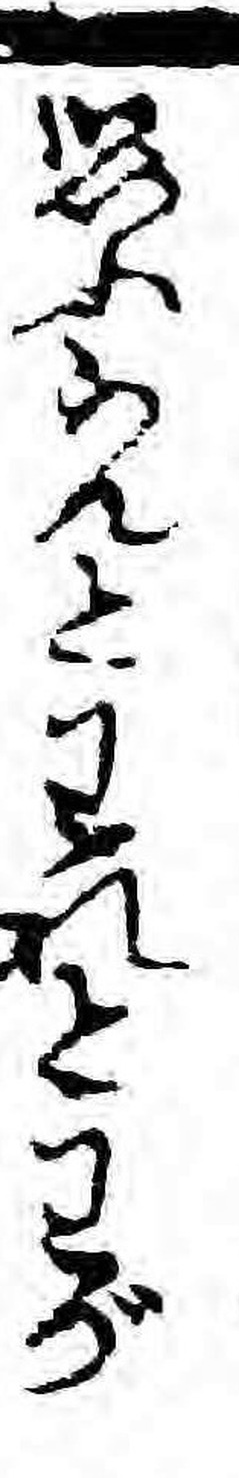思ふらんとわれとわが
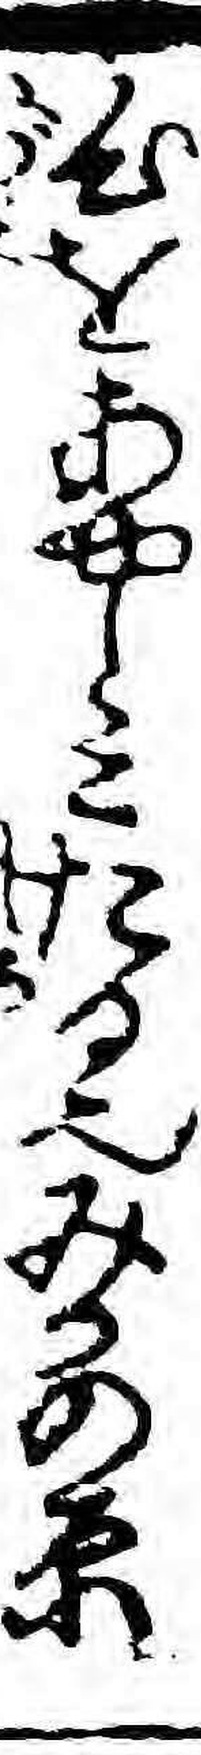心をあやしみたる也みかの原
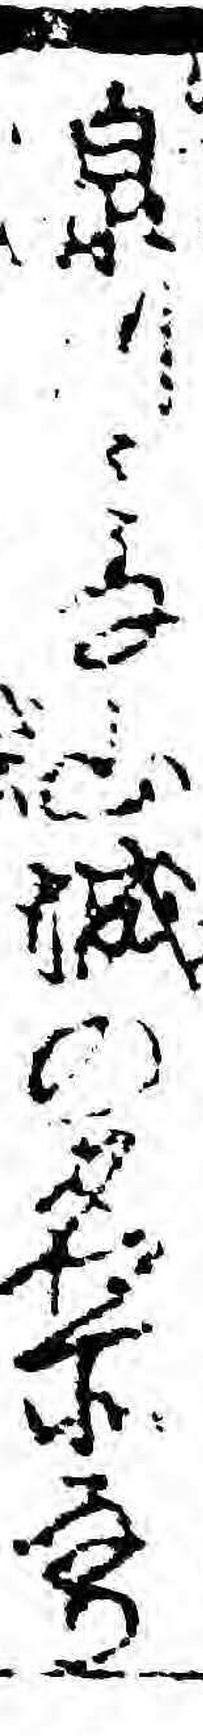泉川みな山城の名所なり
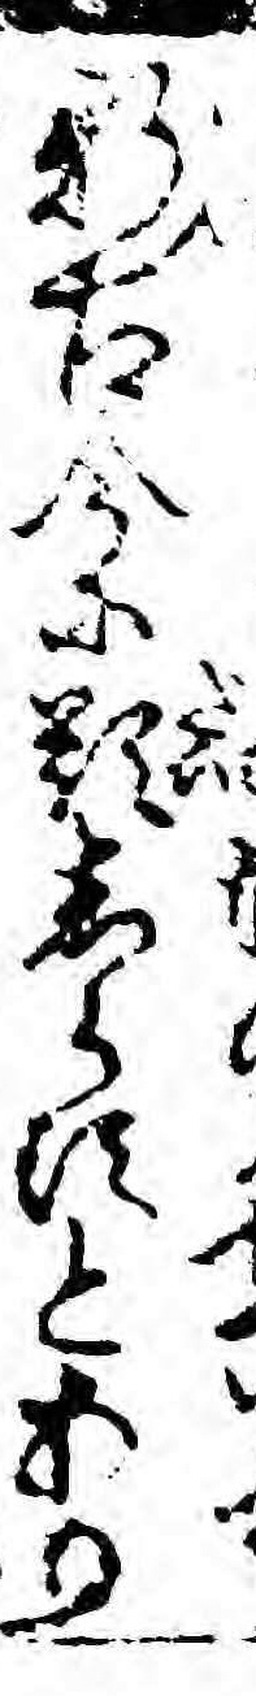新古今に題しらすとあり
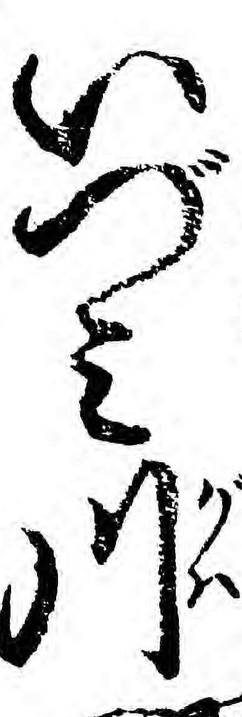いづみ川
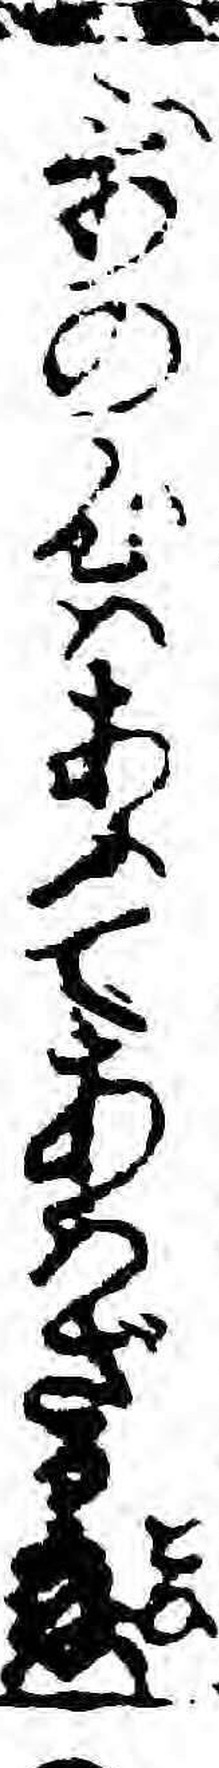哥の心はあふてあはざる恋
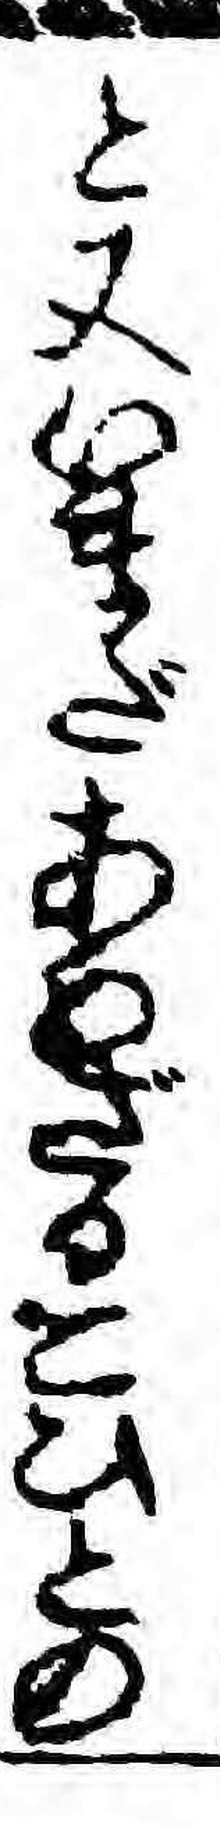と又いまだあはさるこひとの
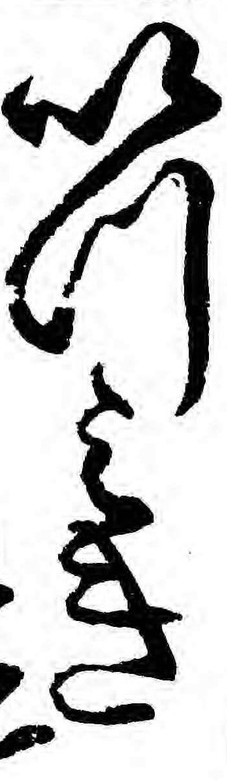いつみき
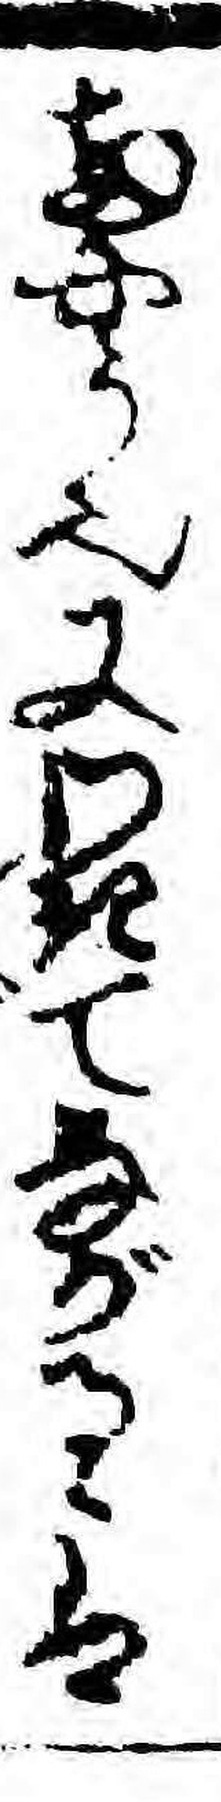両やう也又わきてながるゝは
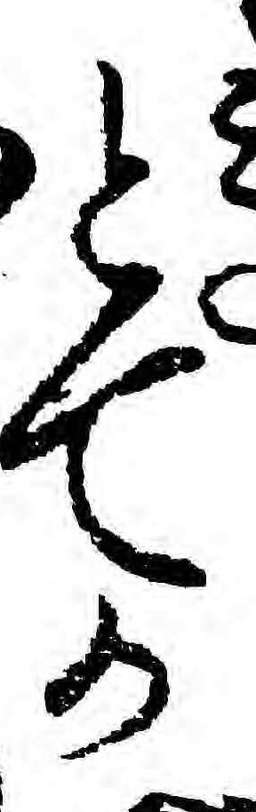とてか
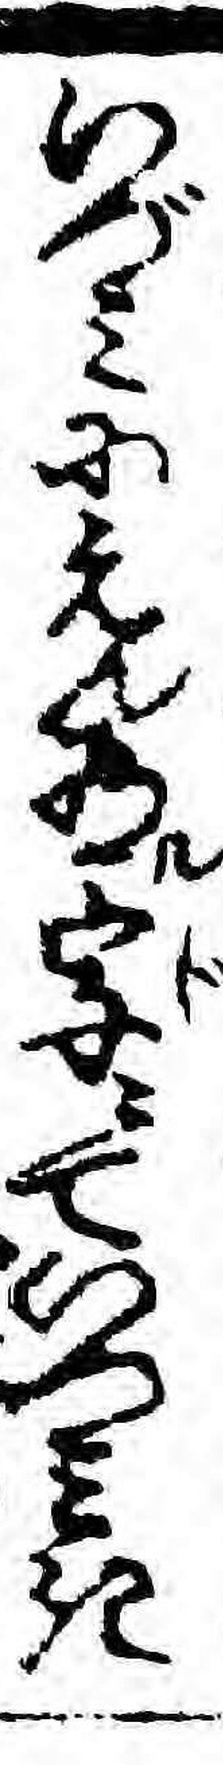いづみにえん有る字にていつみき
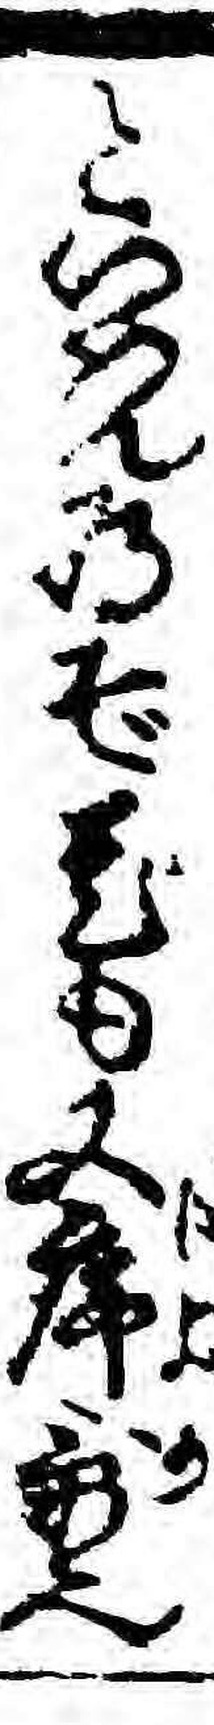といはん為ぞ是も又序哥也
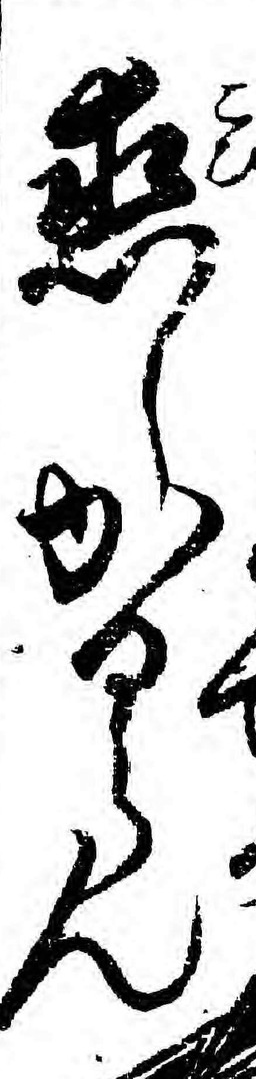恋しかるらん
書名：頭書和歌注譯／壽賀多百人一首小倉錦
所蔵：国文学研究資料館
